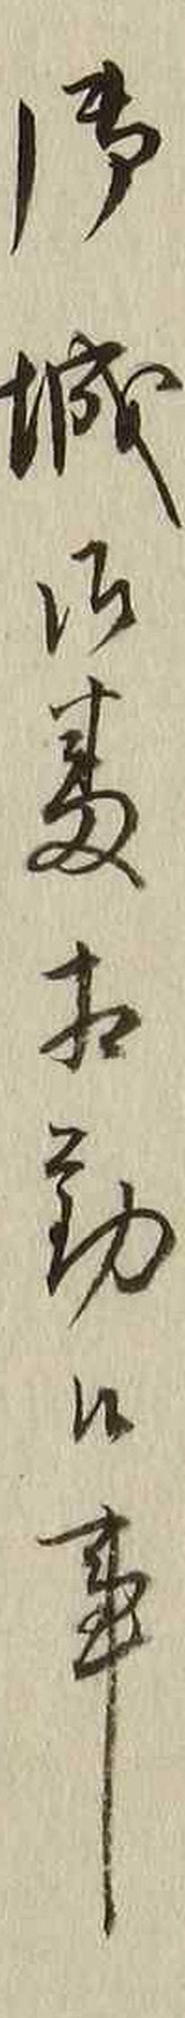御城御番相勤候事
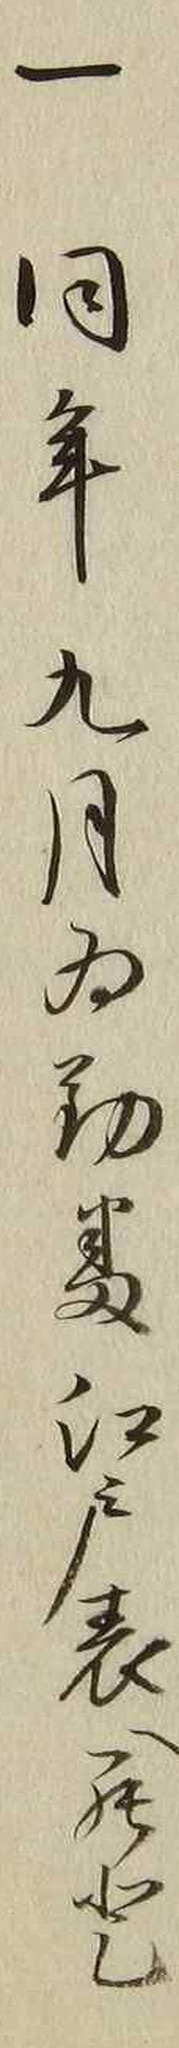一同年九月為勤番江戸表へ罷登
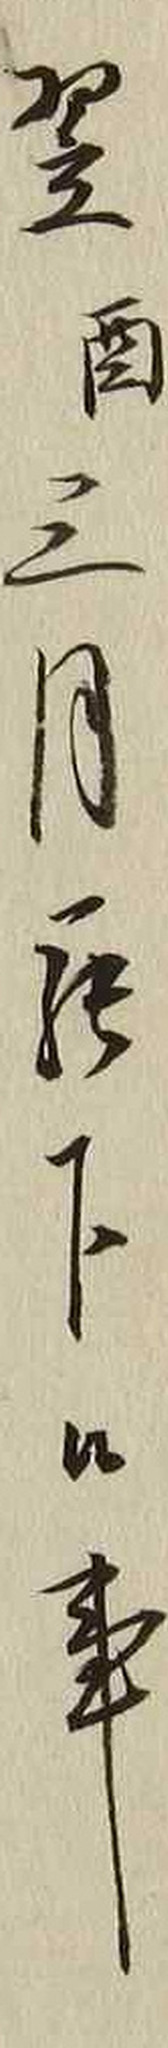翌酉三月罷下候事
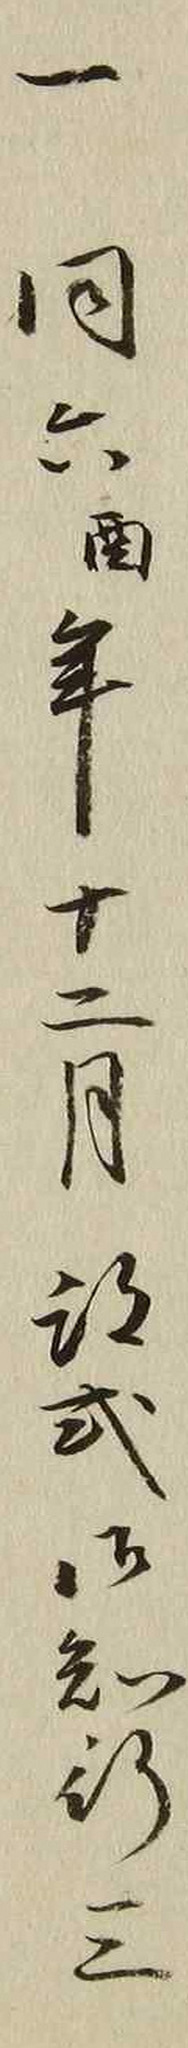一同六酉年十二月跡式御知行三
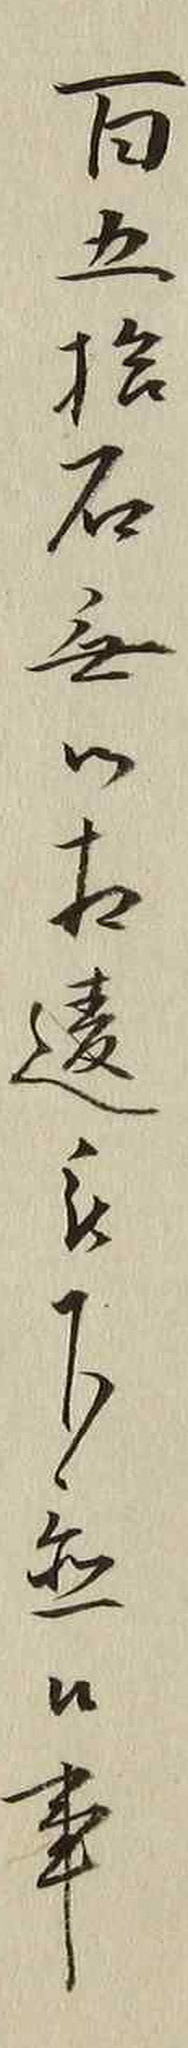百五拾石無御相違被下置候事
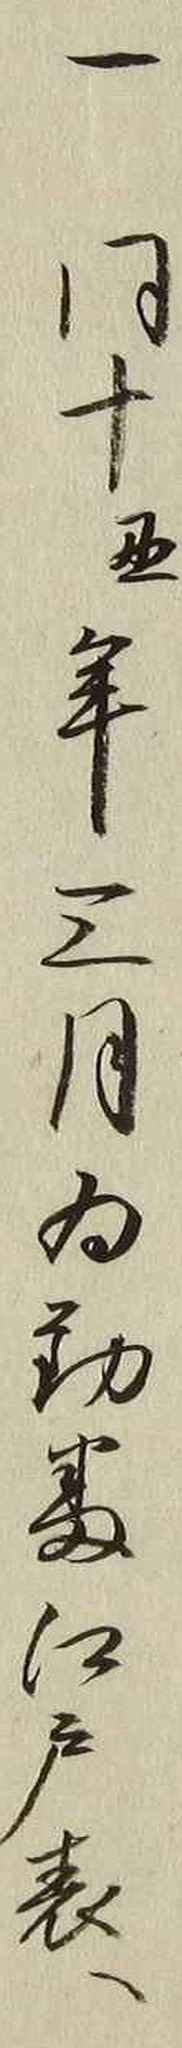一同十丑年三月為勤番江戸表へ
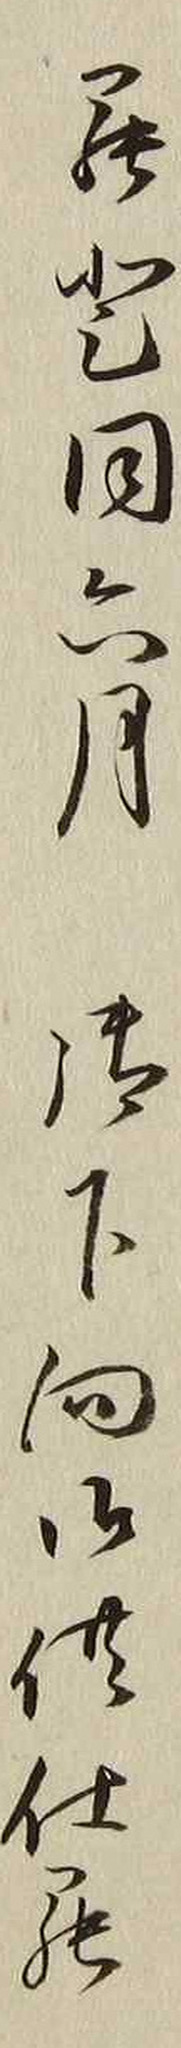罷登同六月御下向御供仕罷
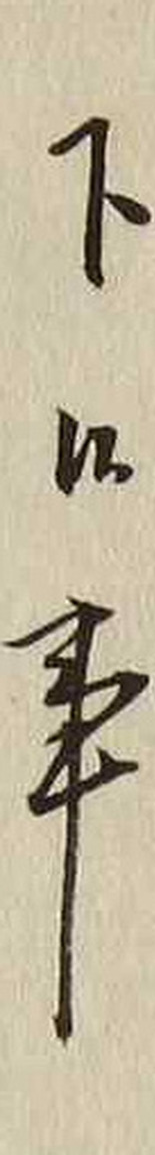下候事
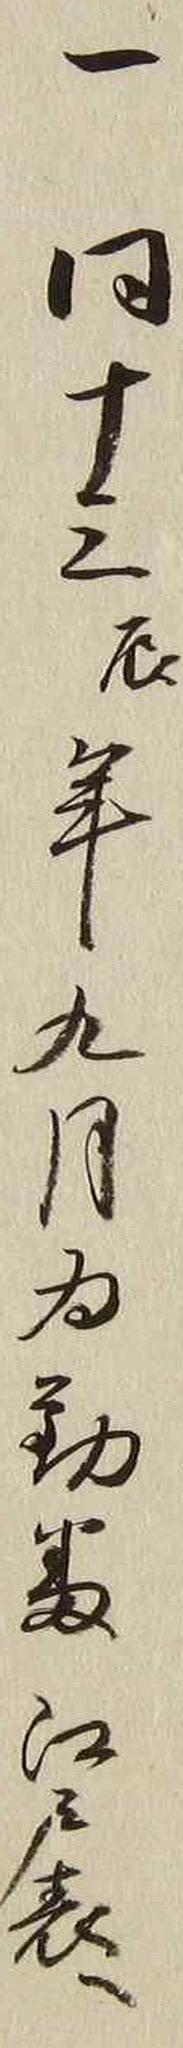一同十三辰年九月為勤番江戸表へ
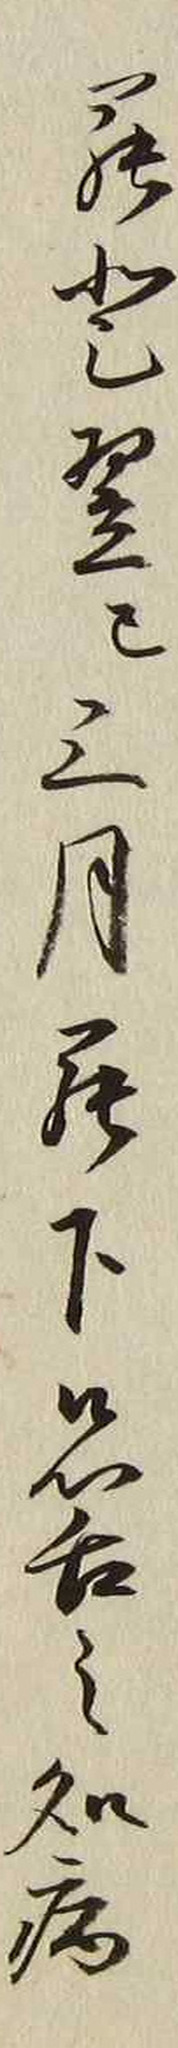罷登翌巳三月罷下候筈之処病
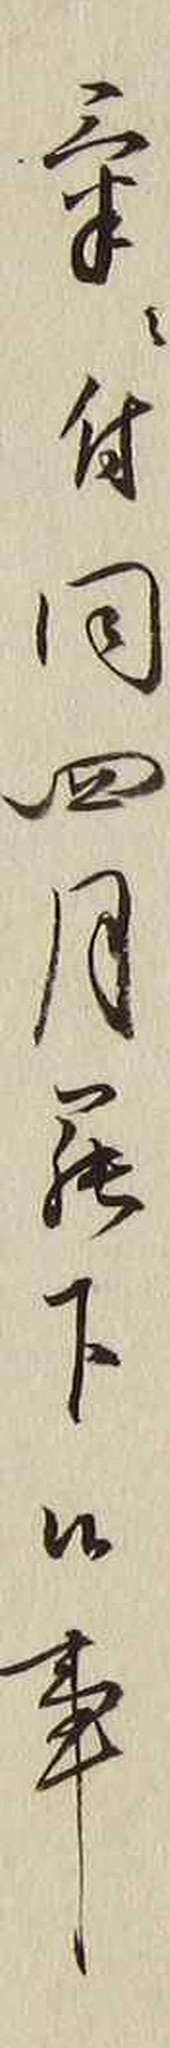気ニ付同四月罷下候事
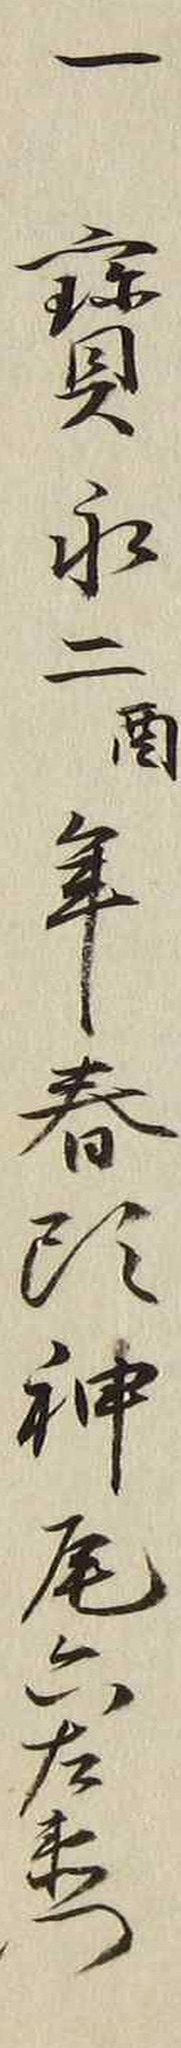一宝永二酉年春頭神尾六左衛門
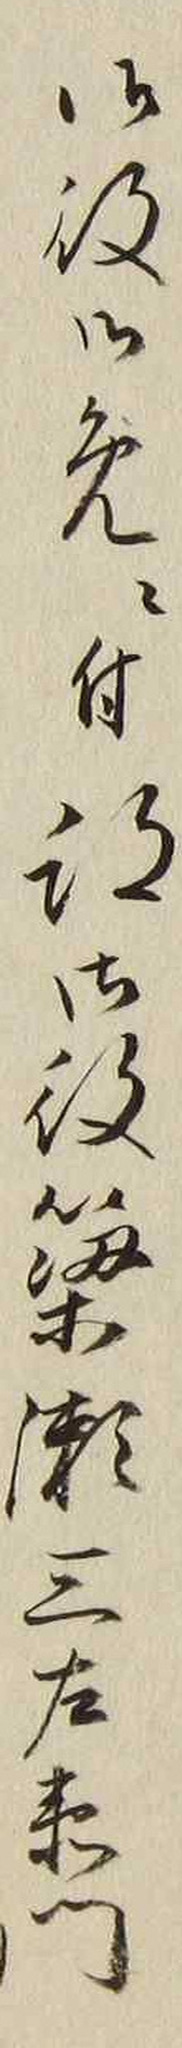御役御免ニ付跡御役簗瀬三左衛門
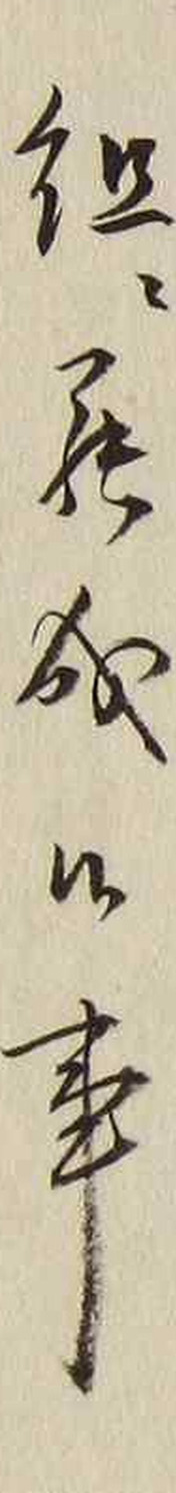組ニ罷成侯事

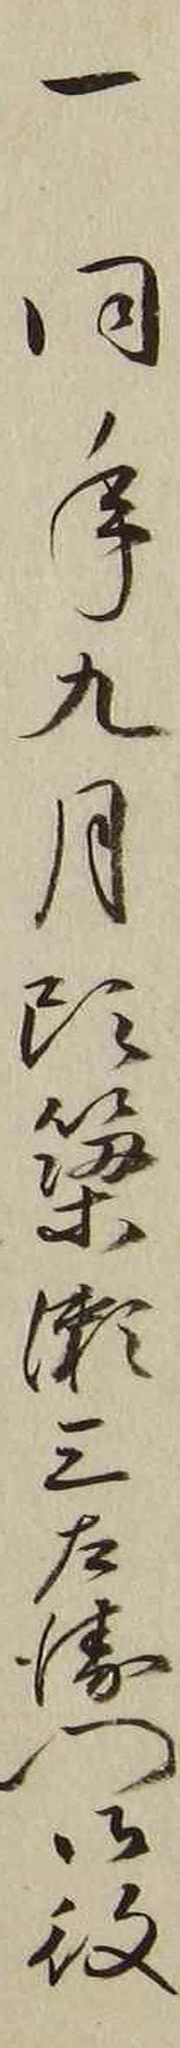一同年九月頭簗瀬三左衛門御役
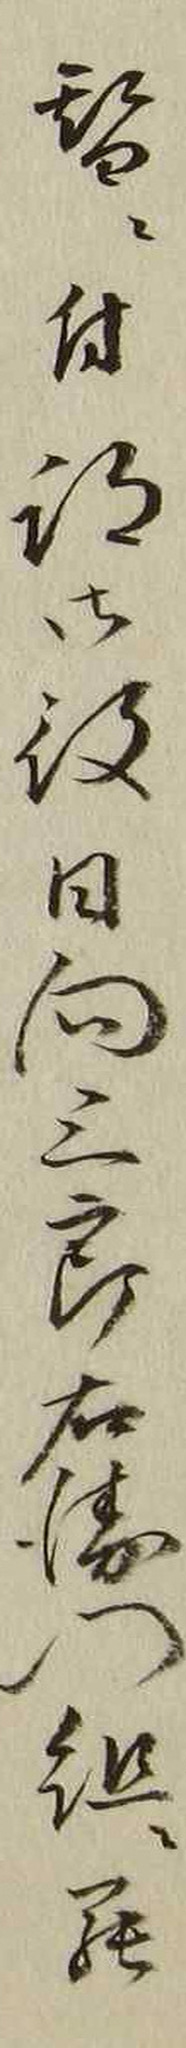替ニ付跡御役日向三郎右衛門組ニ罷
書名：諸士系譜　巻之22　い之部22
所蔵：会津若松市立会津図書館
